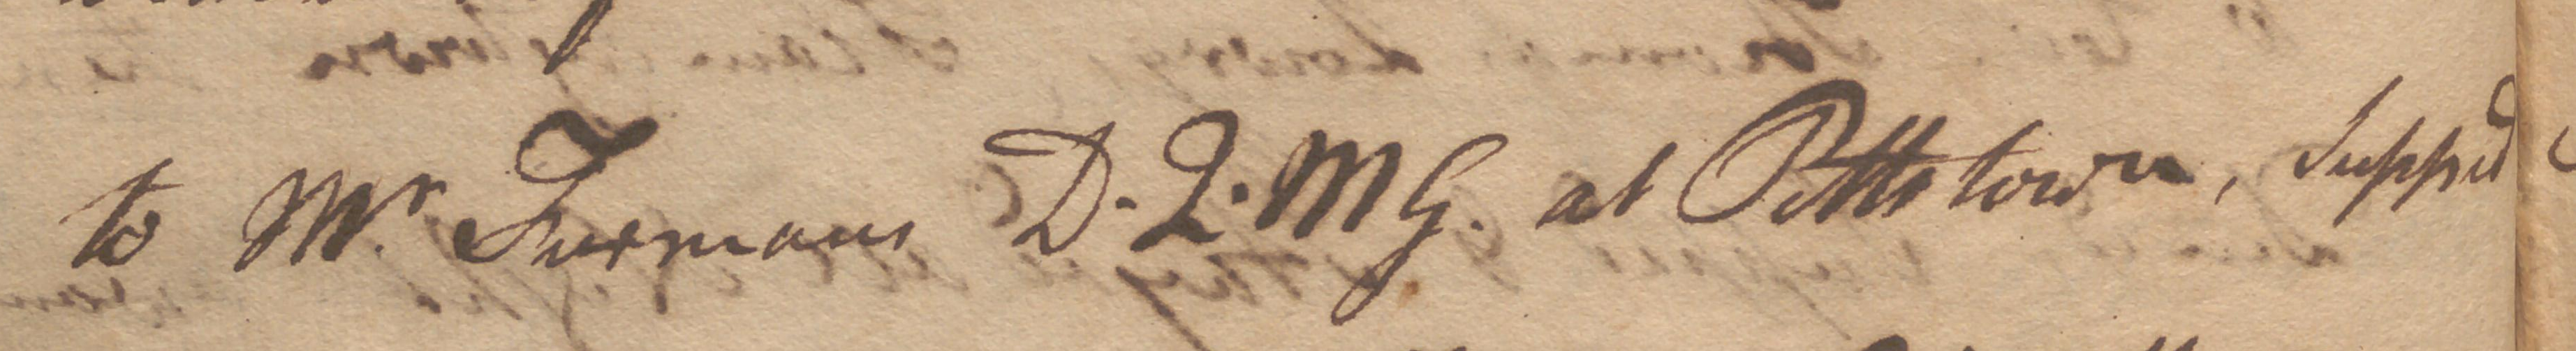to M^r. Furmans D.Q.MG. at Pittstowrn, supped
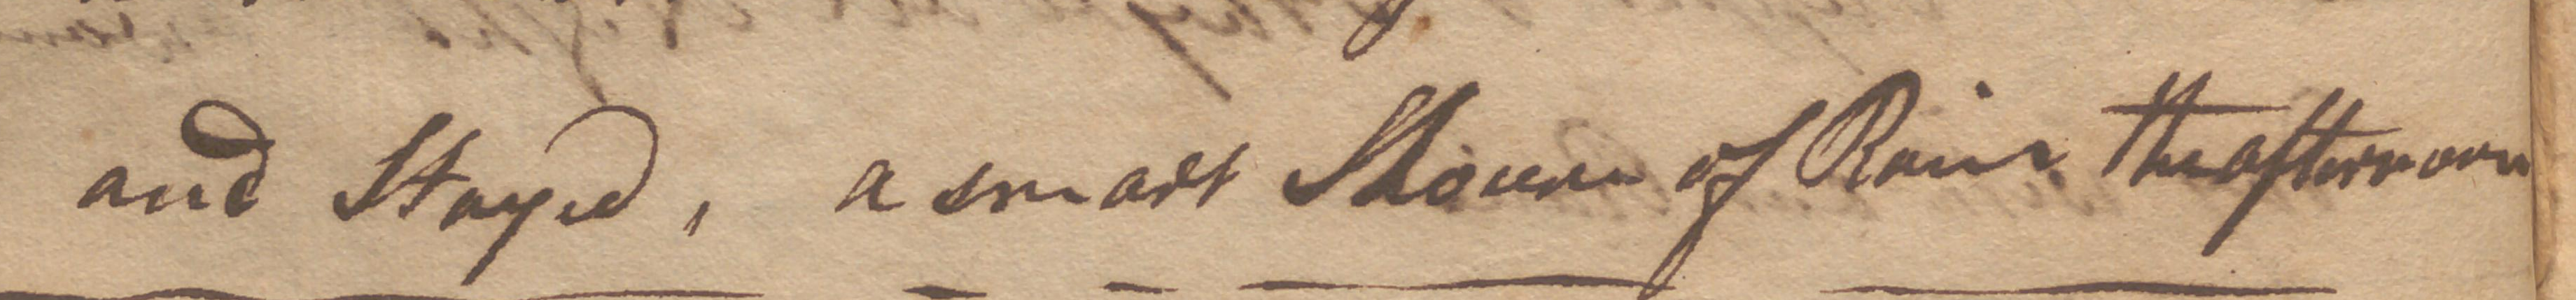and Stayed, a smart Shoure of Rain the afternoon
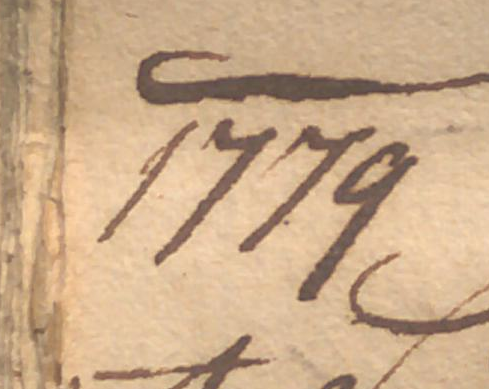1779
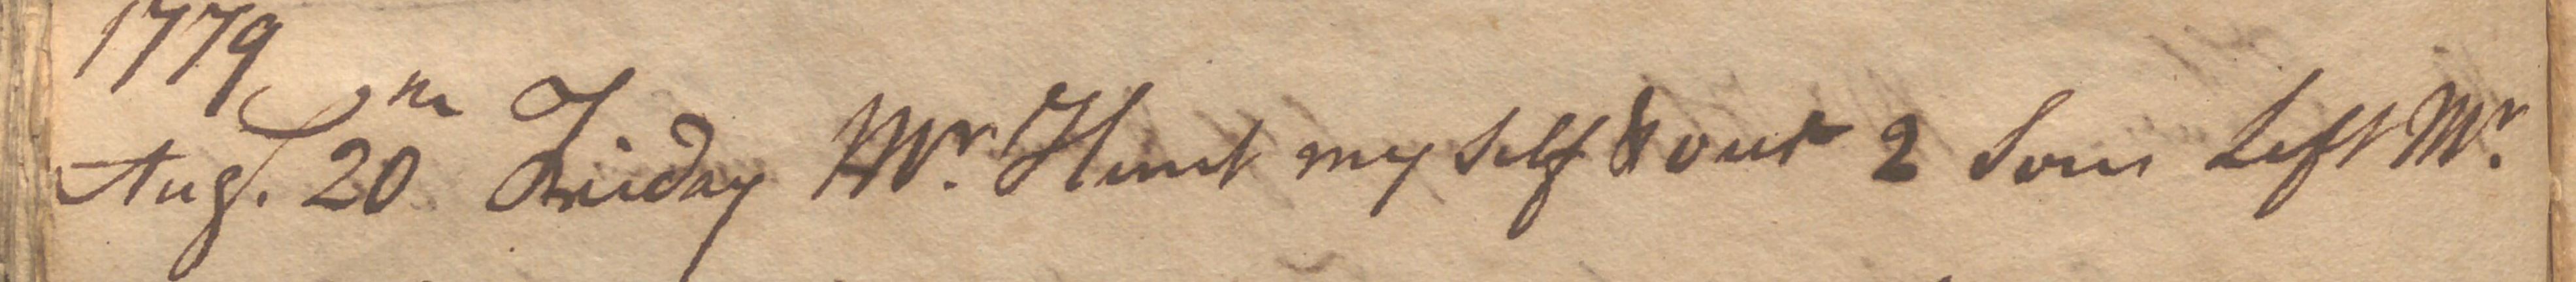Aug^. 20 Fieday M^r. Hunt my self & our 2 Sons left M^r.
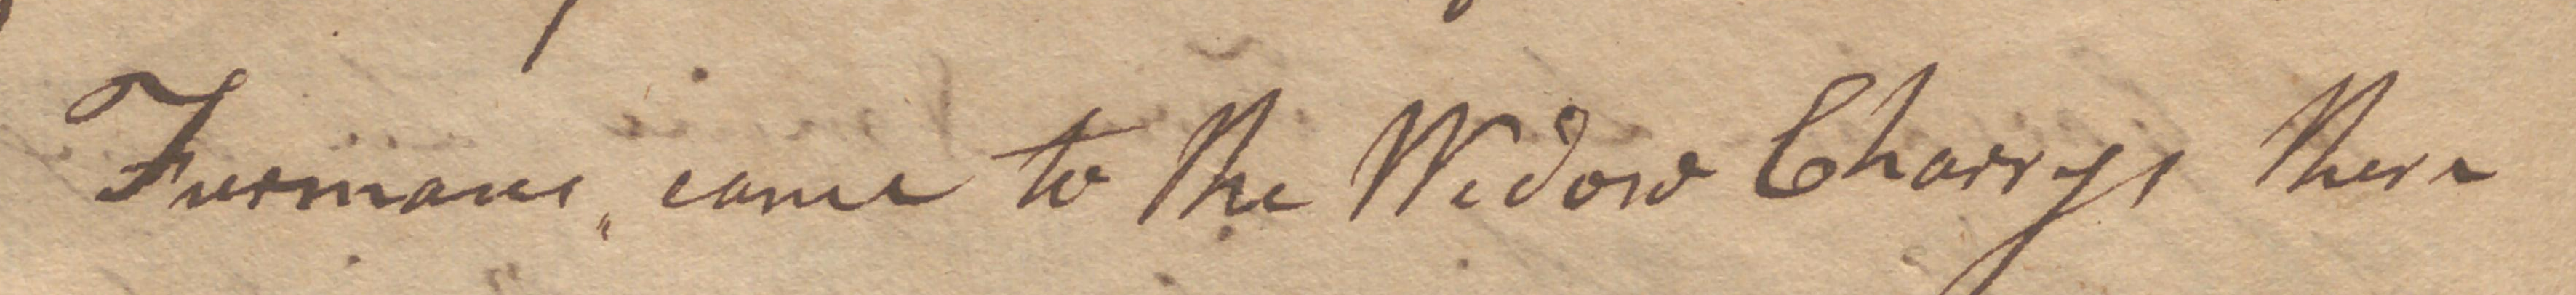Furmans, came to the Widow Charrys there
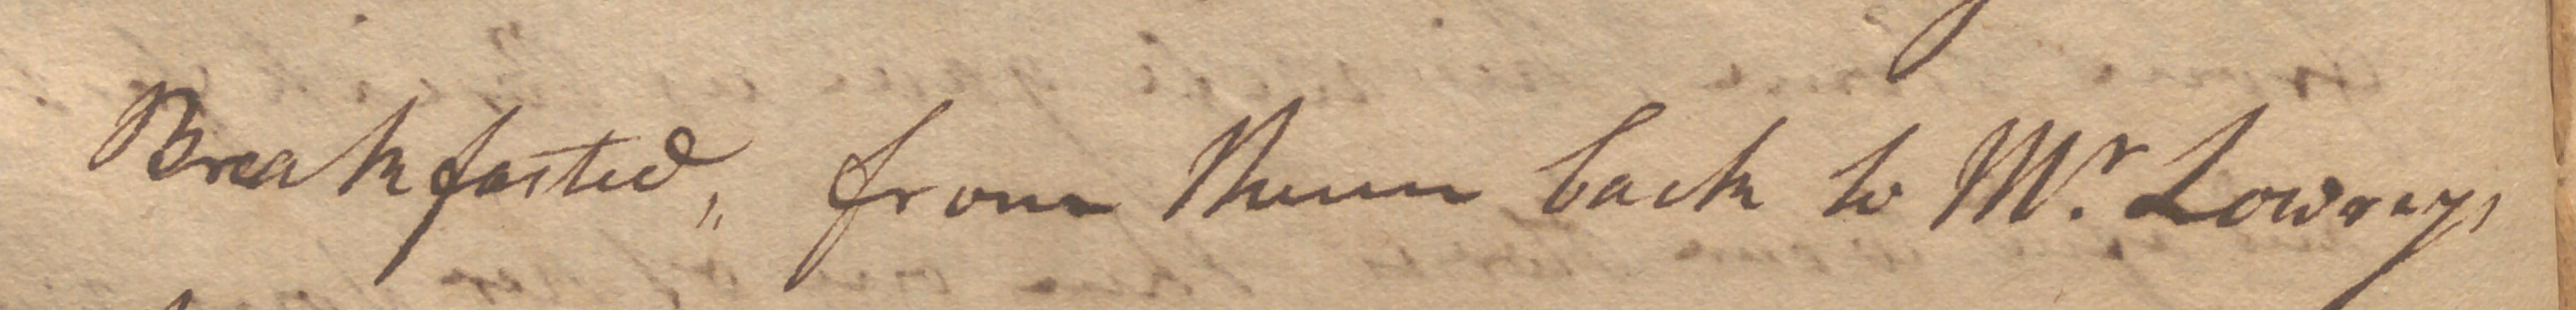Breakfasted, from thence back to M^r. Lowreys
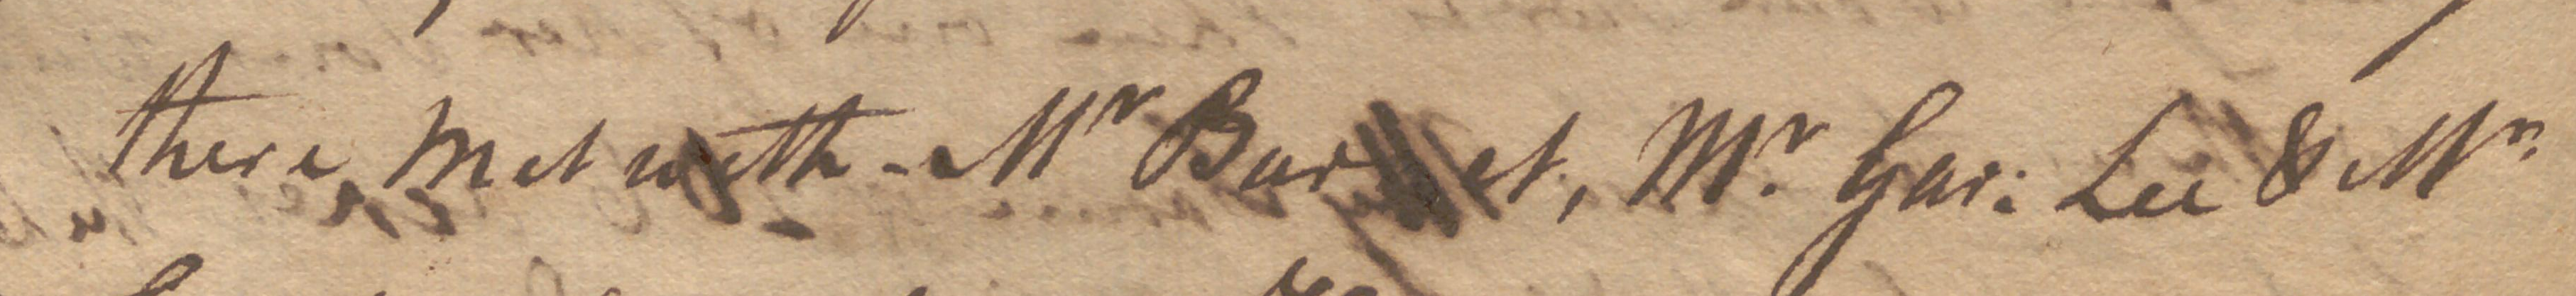there met with M^r Burnet, M^r. Gar: Lee & M^r.
